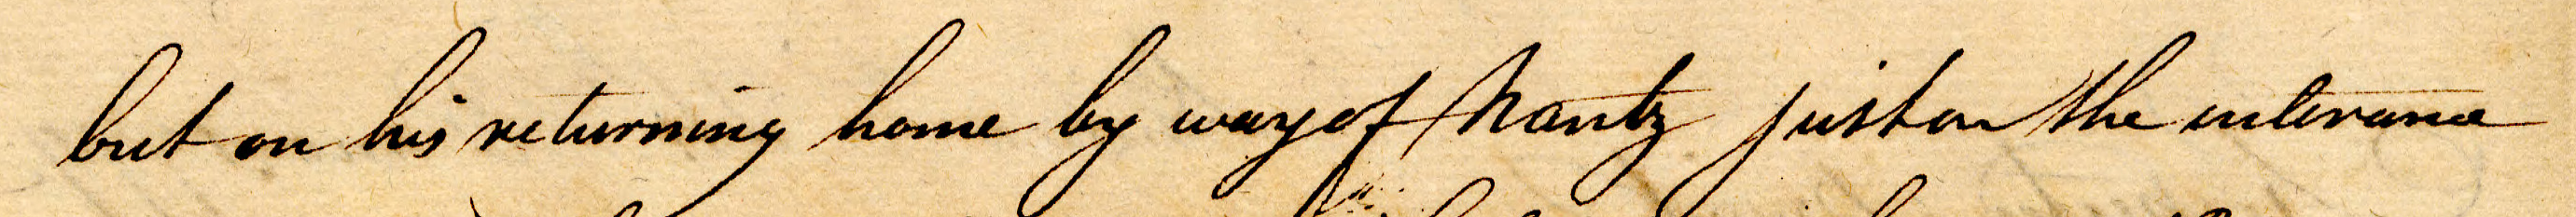but on his returning home by way of Nantz, just as the entrance
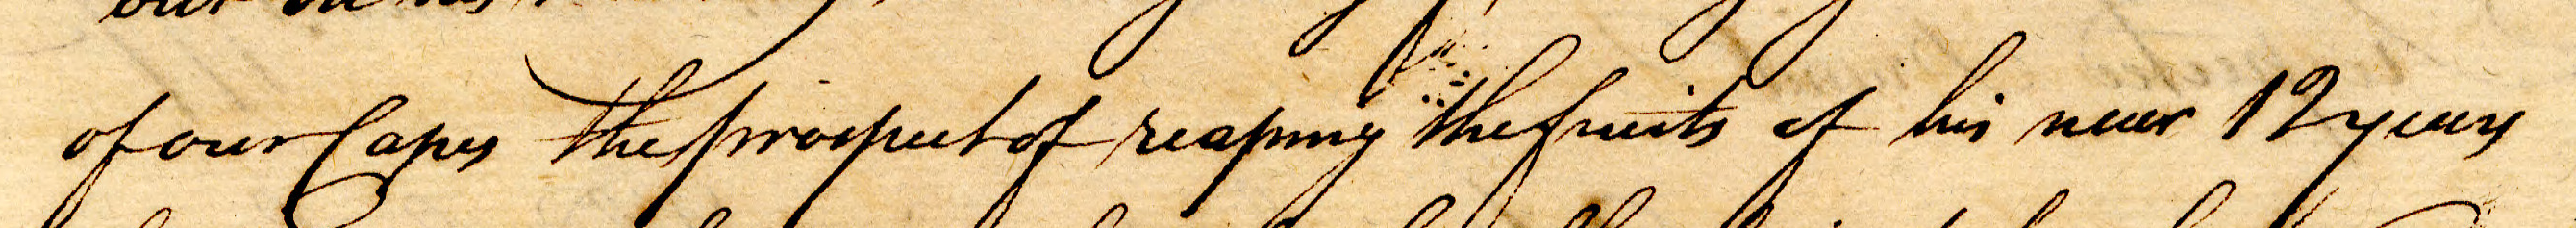of our Capes the prospect of reaping the fruits of his near 12 years
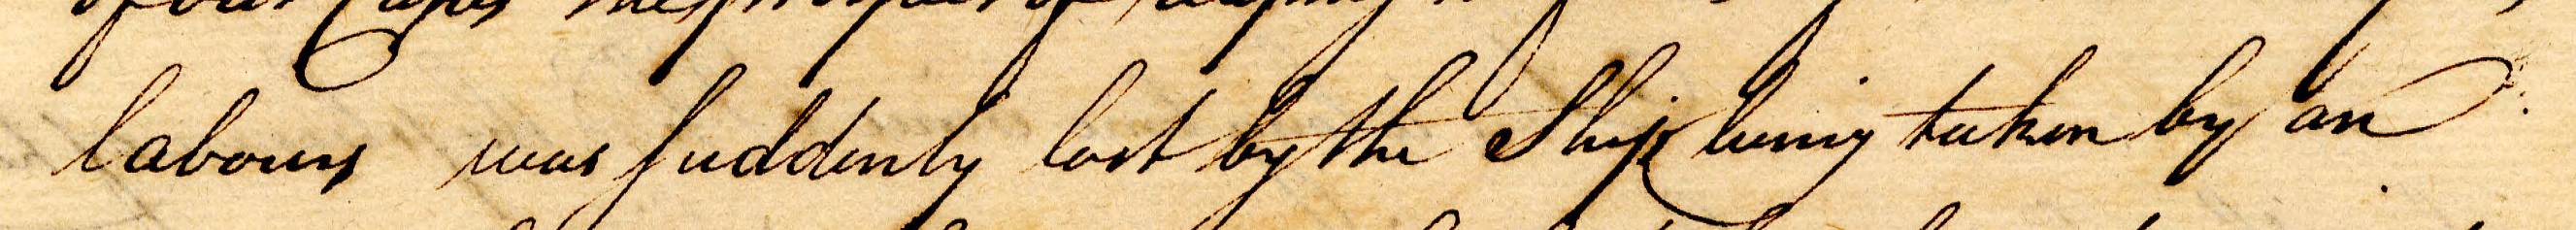labours was suddenly lost by the Ships being taken by an
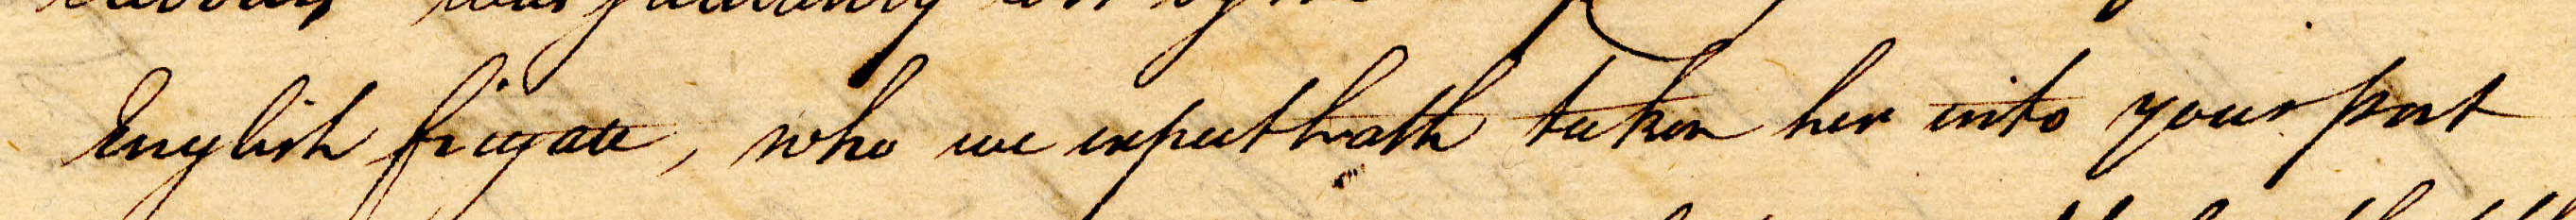English frigate, who we expect hath taken her into your port
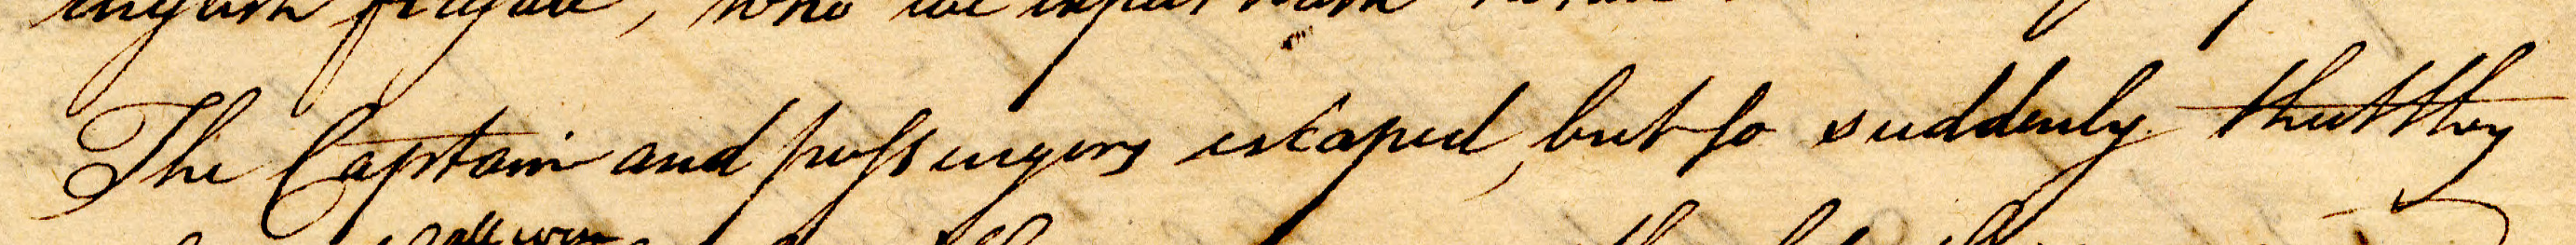The Captain and passengers escaped, but so suddenly that they
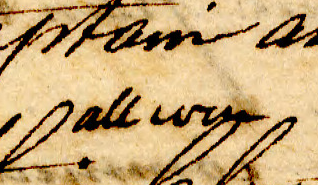all ure
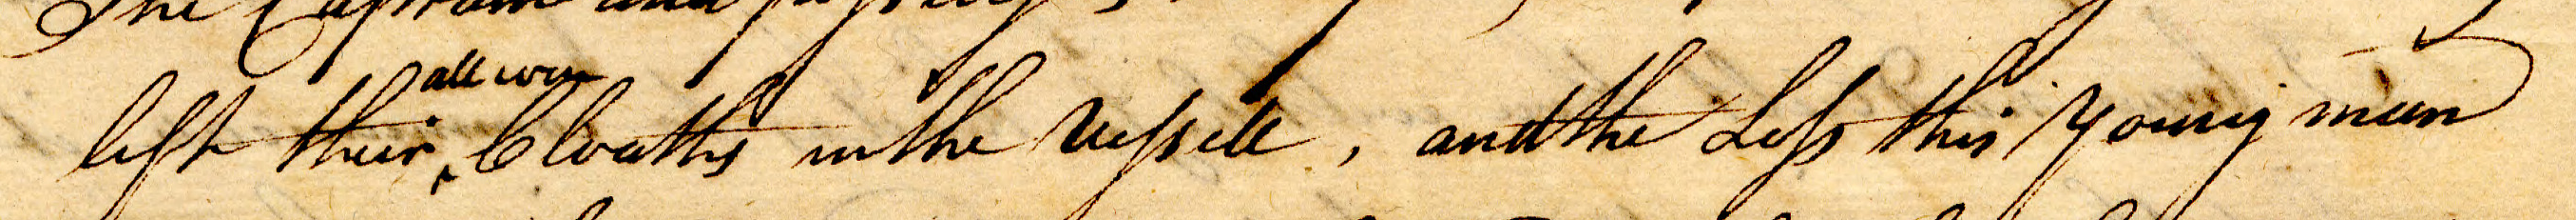left their ^ Cloaths in the Vessell, and the Loss this young man
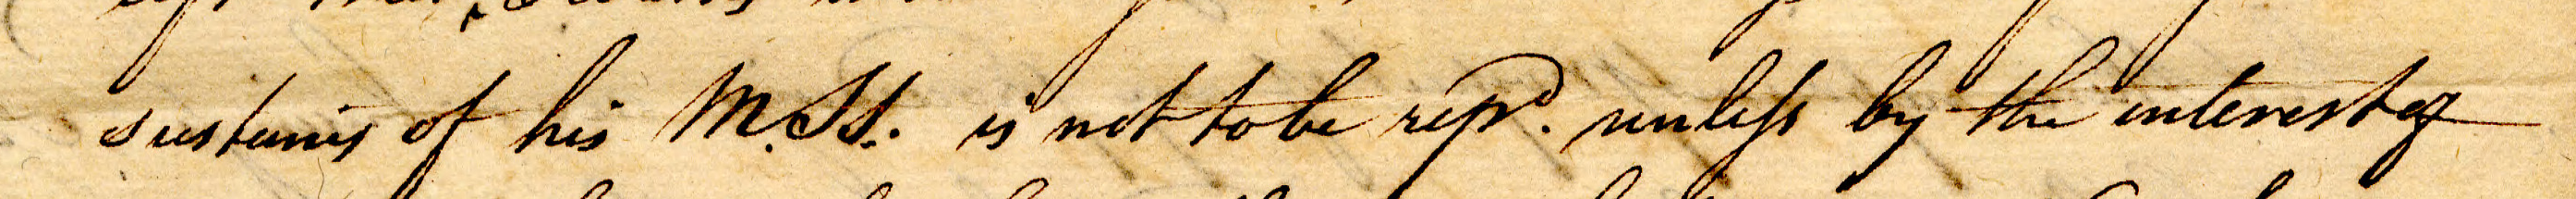sustains of his M.S.S. is not to be rep^d. unless by the interest of
